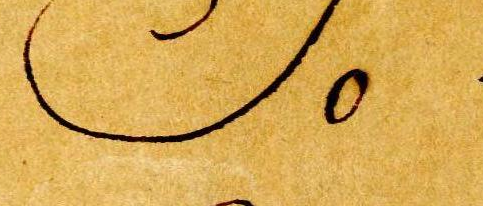To
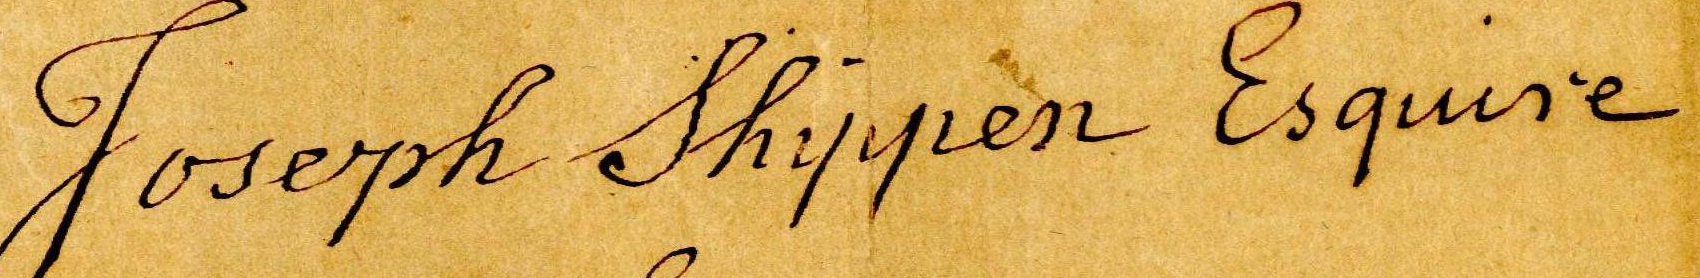Joseph Shippen Esquire
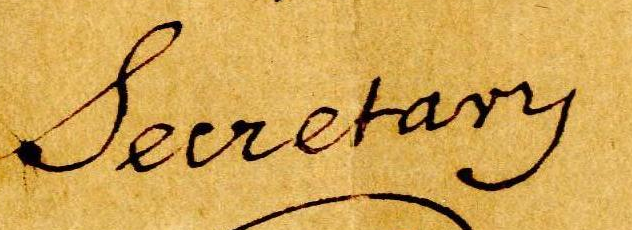Secretary
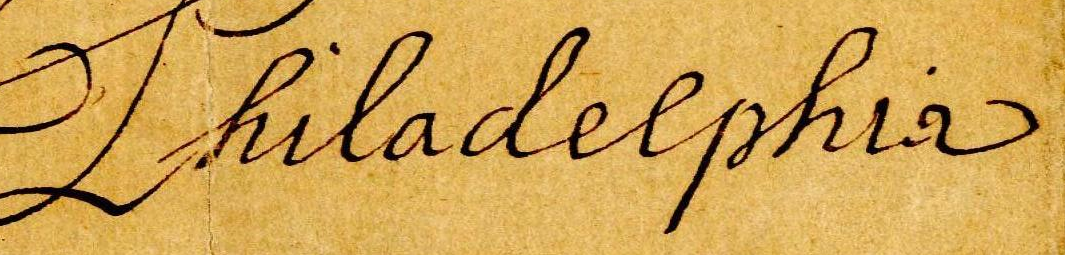Philadelphia
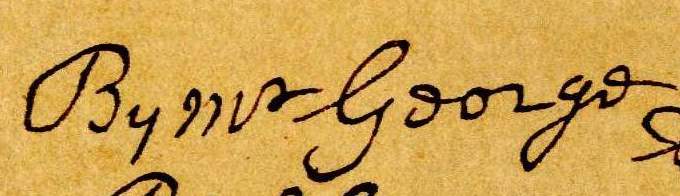By M^r George
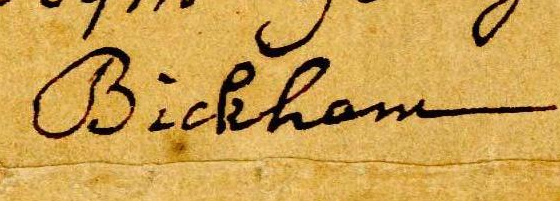Bickham
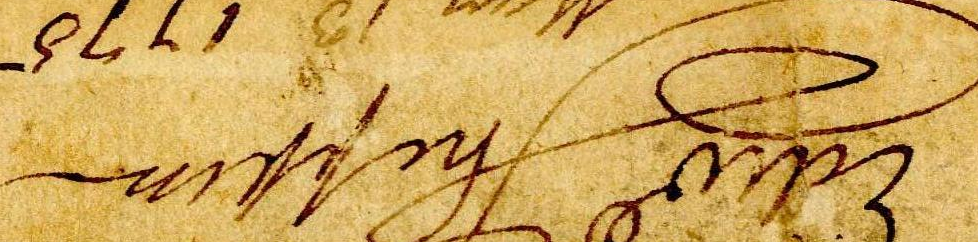Edw Shippen
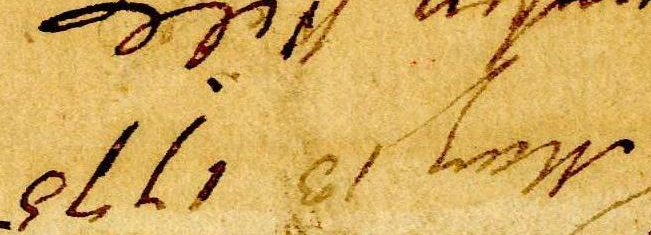May 13 1775
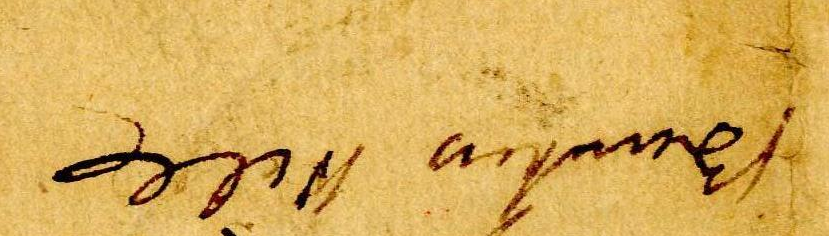Bunker Hill
